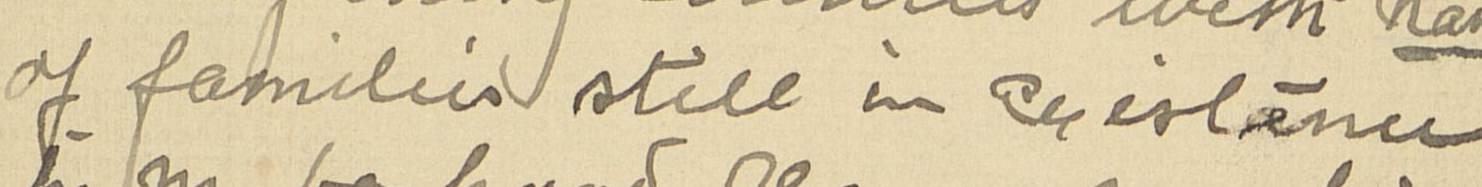of families still in Existence
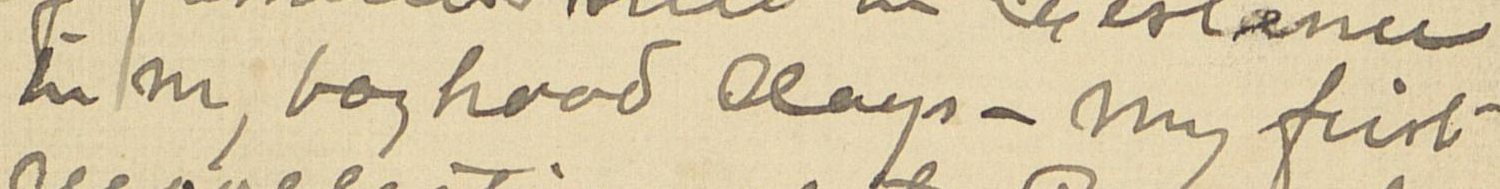him, boyhood days- my first
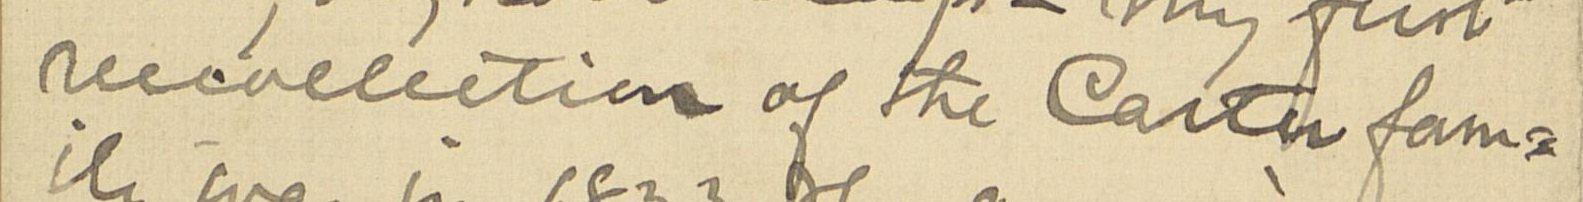recollection of the Carter fam-
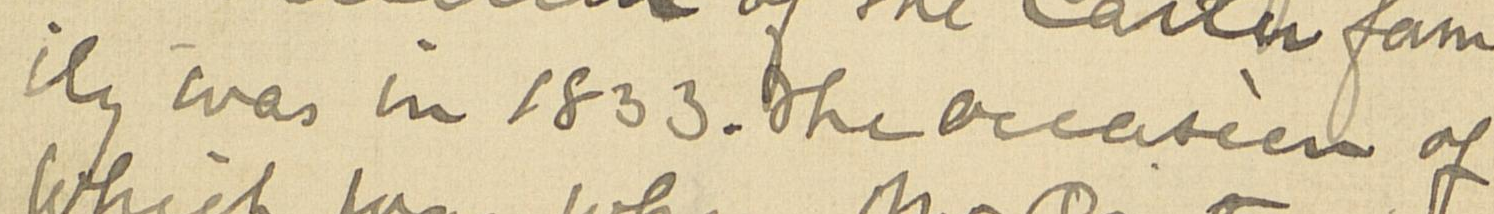-ily was in 1833. the occasion of
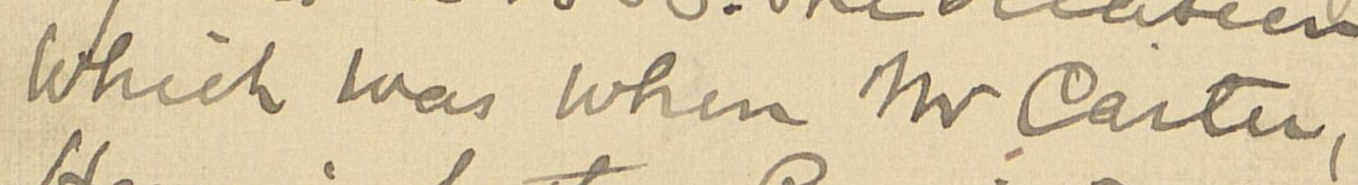which was when M^r Carter,
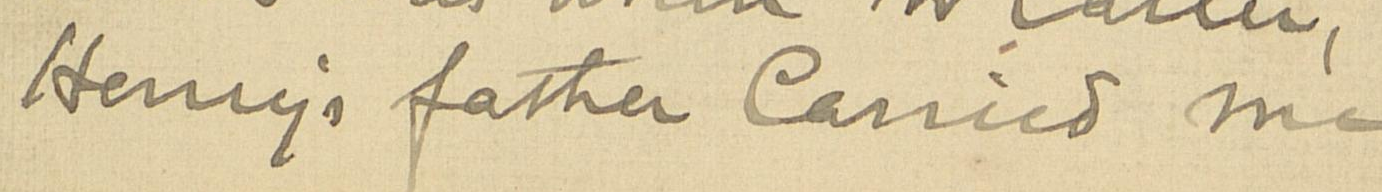Henry's father Carried me
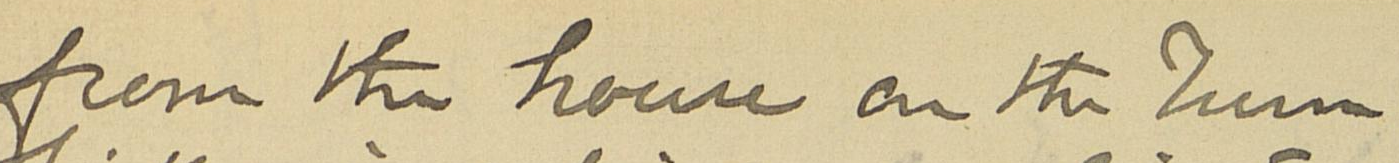from the house on the Turn-
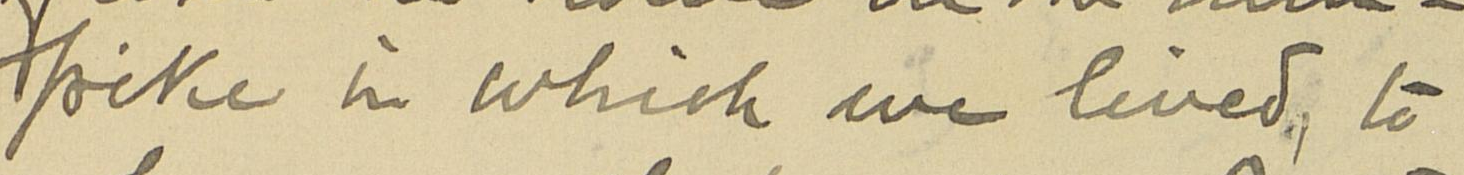-pike in which we lived, to
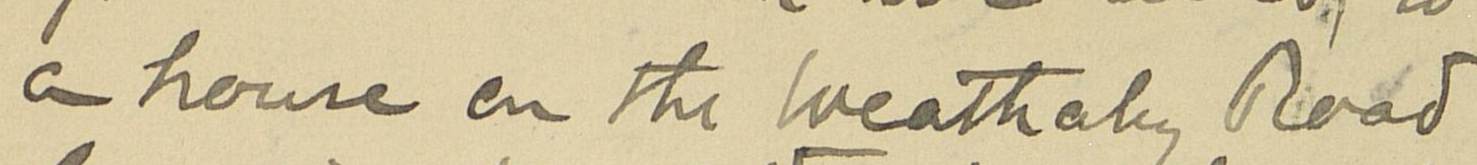a house on the weathaley Road
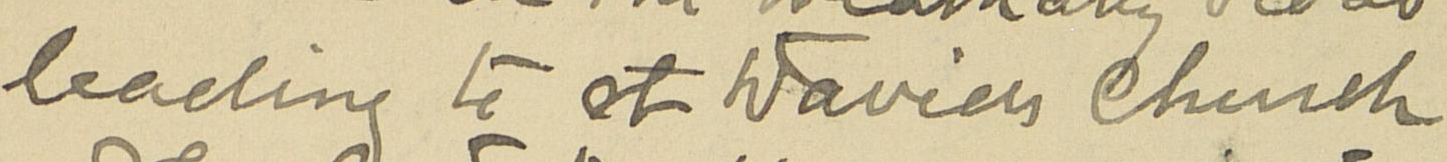leading to ol Waviers Church
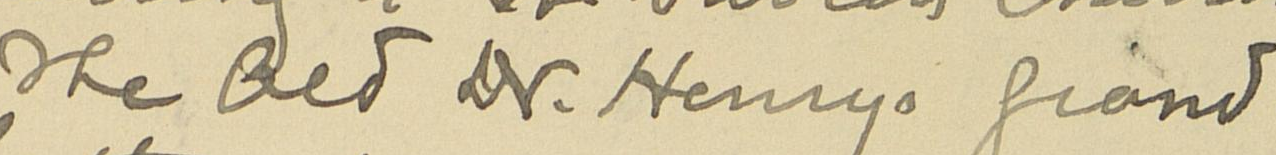The Old N. Henrys grand
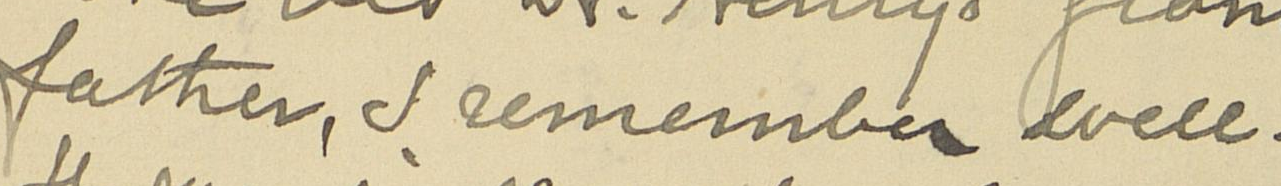father, I remember well.
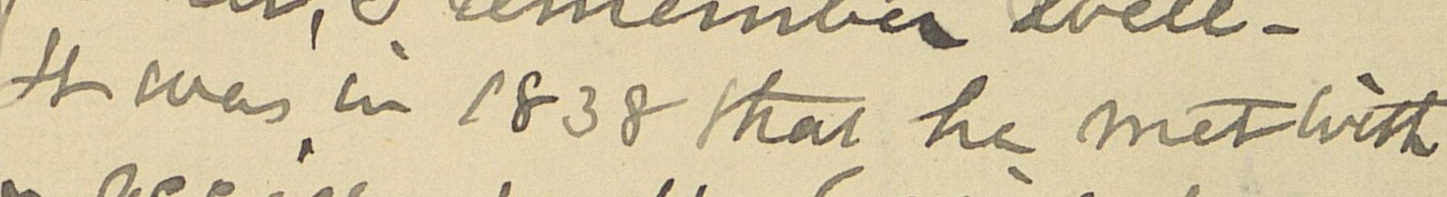It was in 1838 that he met with
